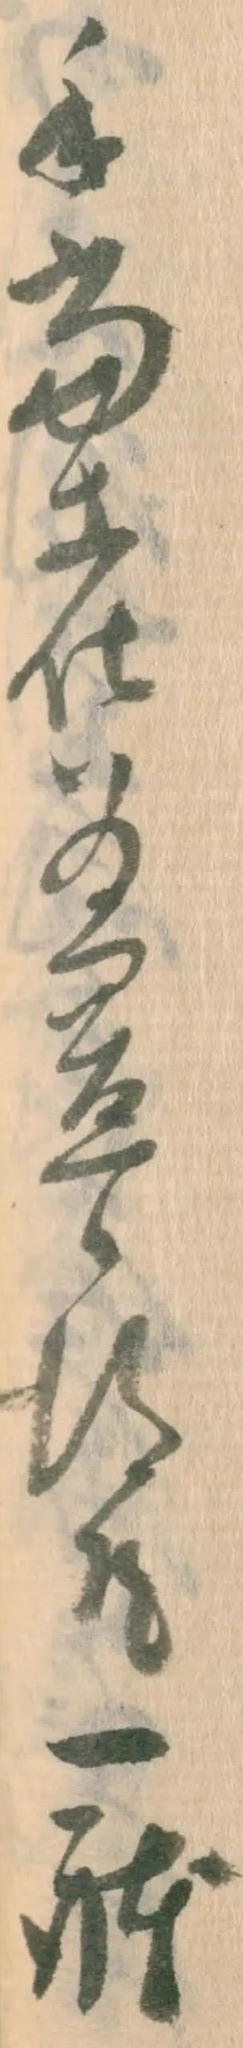手当等仕差置候得共一体
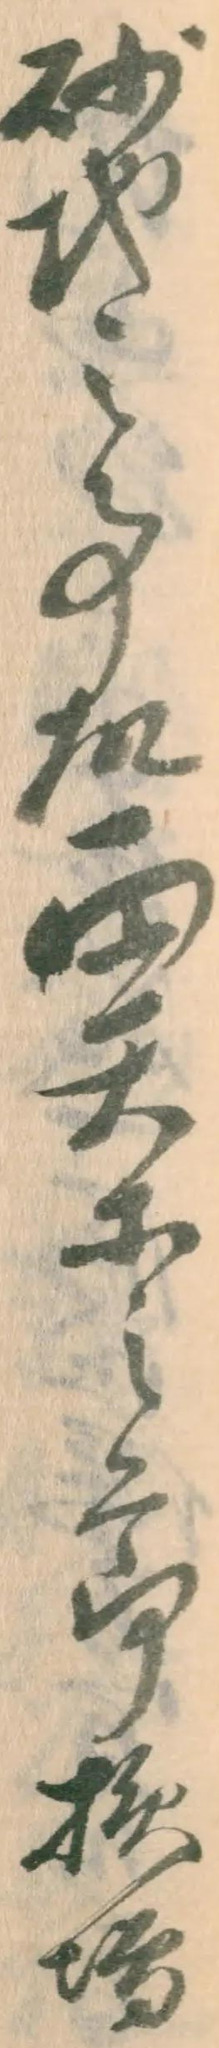砂地之事故雨天等之節損増
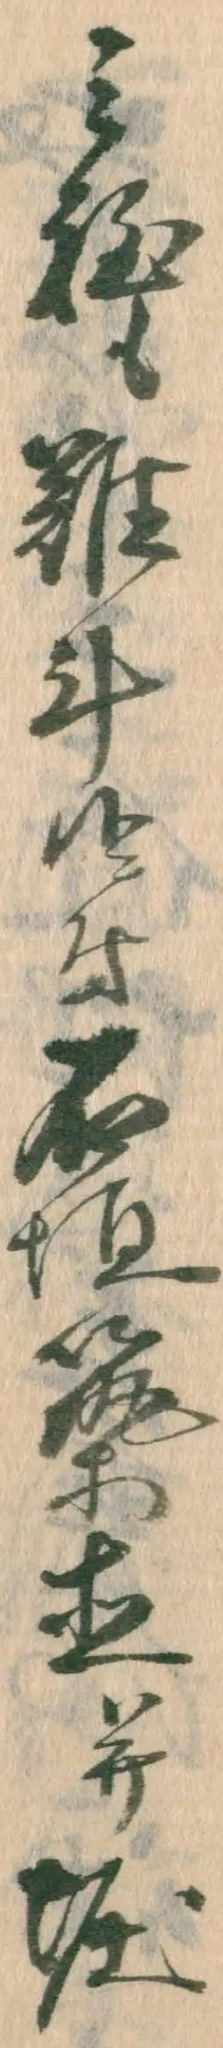之程も難計候ニ付石垣築直幷堀
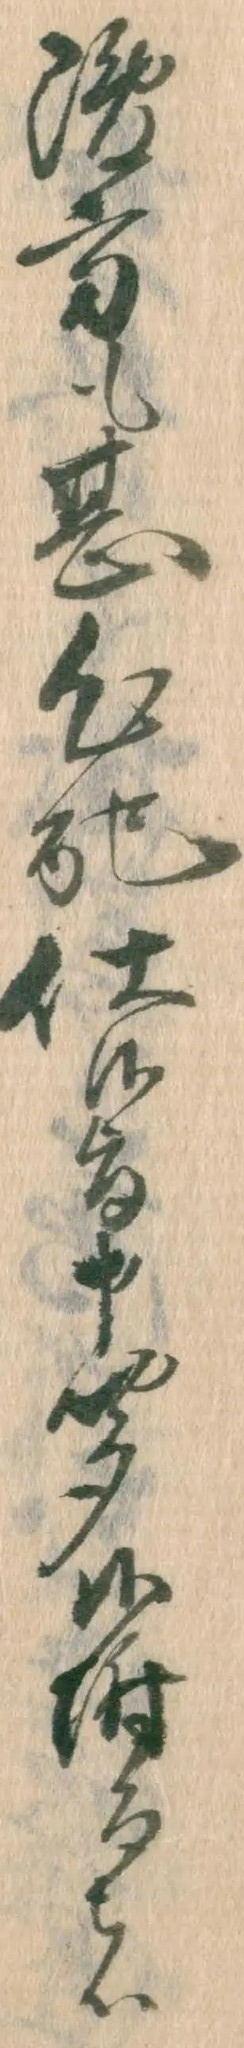浚方も甚心配仕候旨申聞候附而は
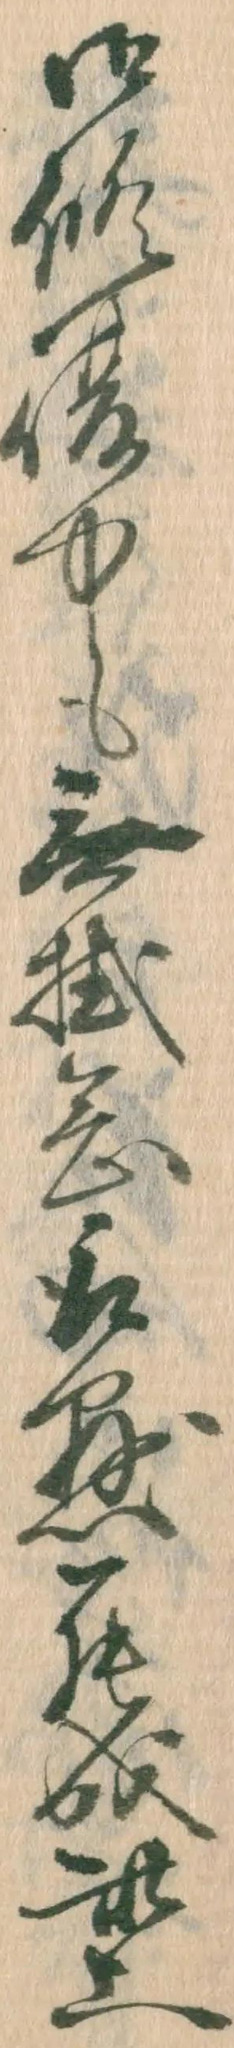御修復中も無掛念取懸罷成此上
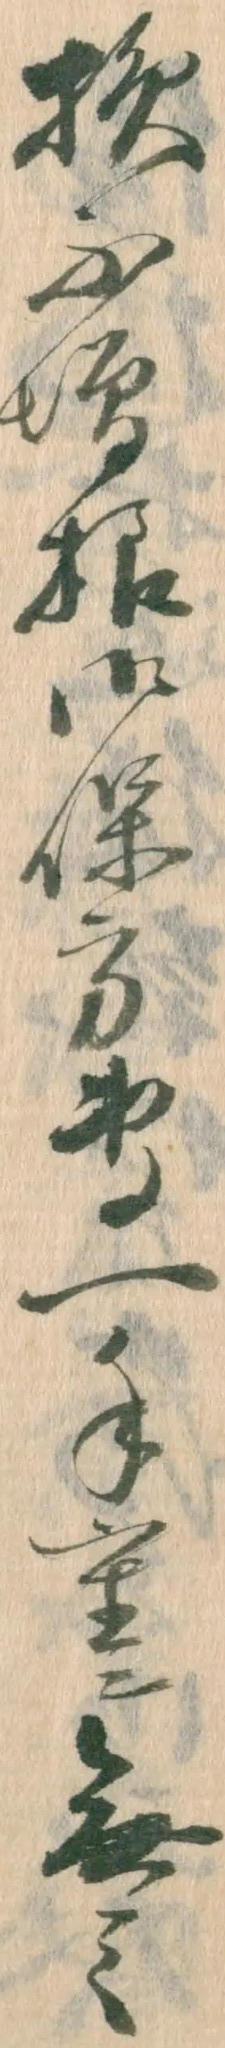損不増様御保方専一手重ニ無之
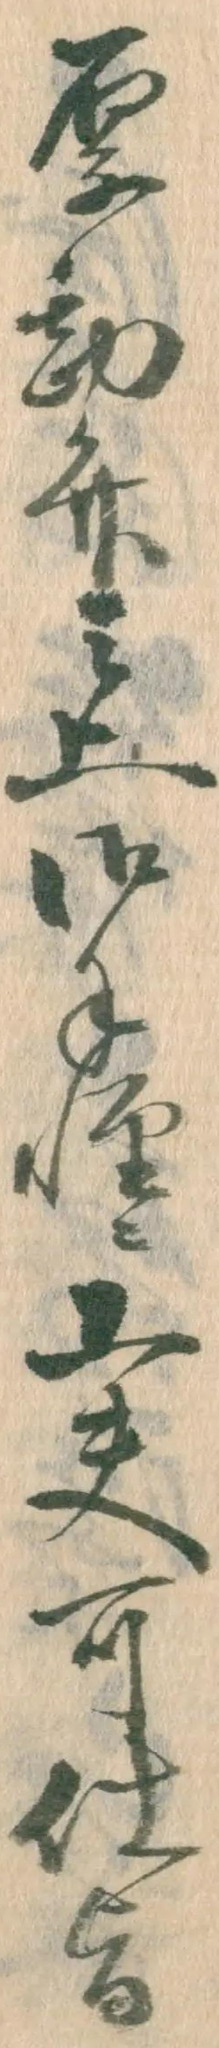厚勘弁之上御手軽ニ工夫可仕旨

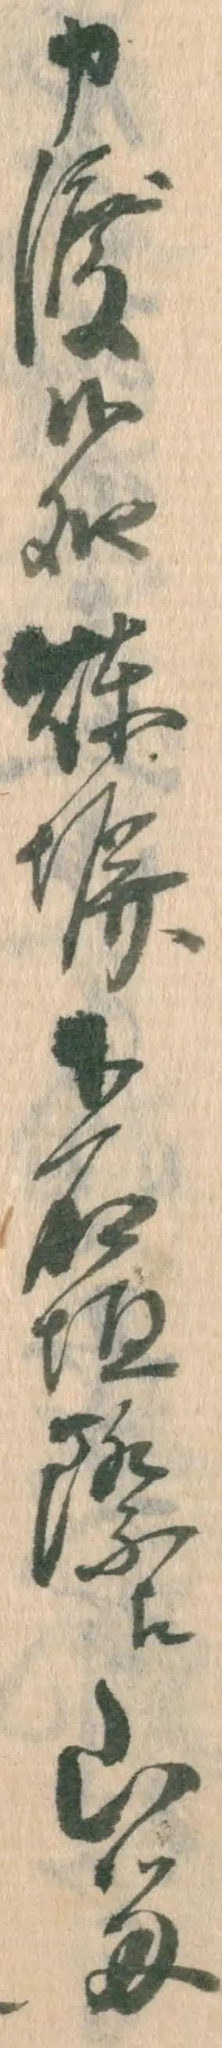申渡候処煉塀下石垣際え山留
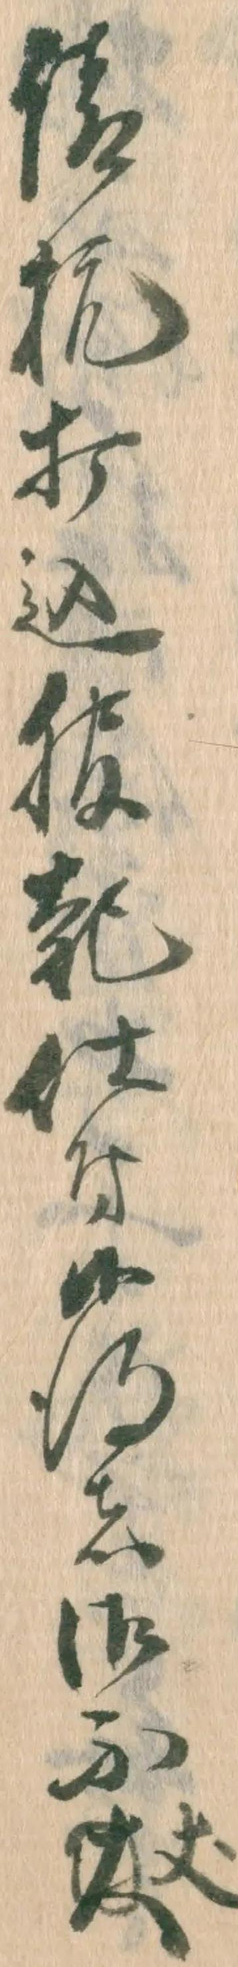請杭打込抜難志付候えは御不丈
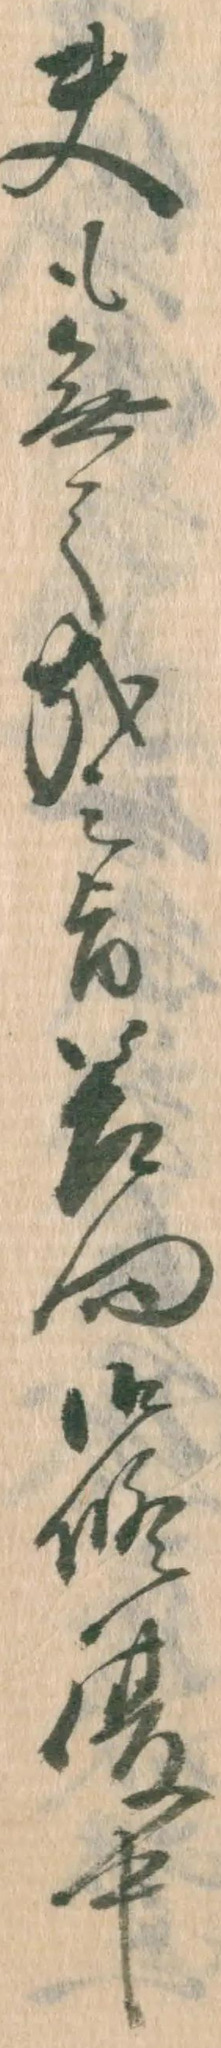夫も無之哉之旨差向御修復中
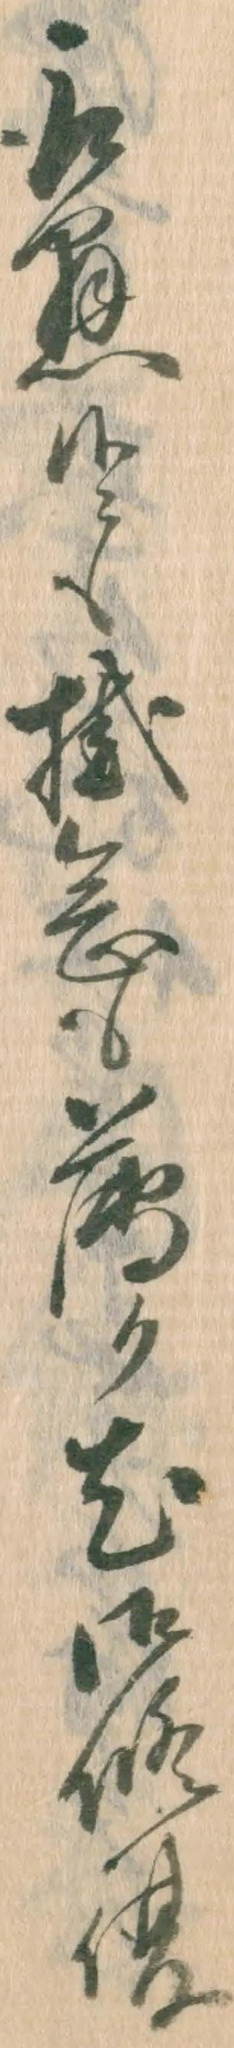取懸候ニも掛念も薄ク尤御修復
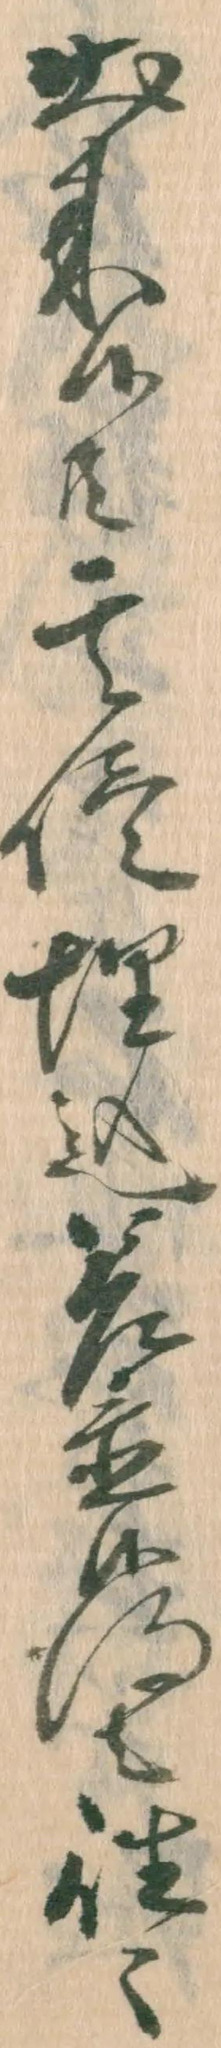出来候共其儘埋込差置候得は徃〻
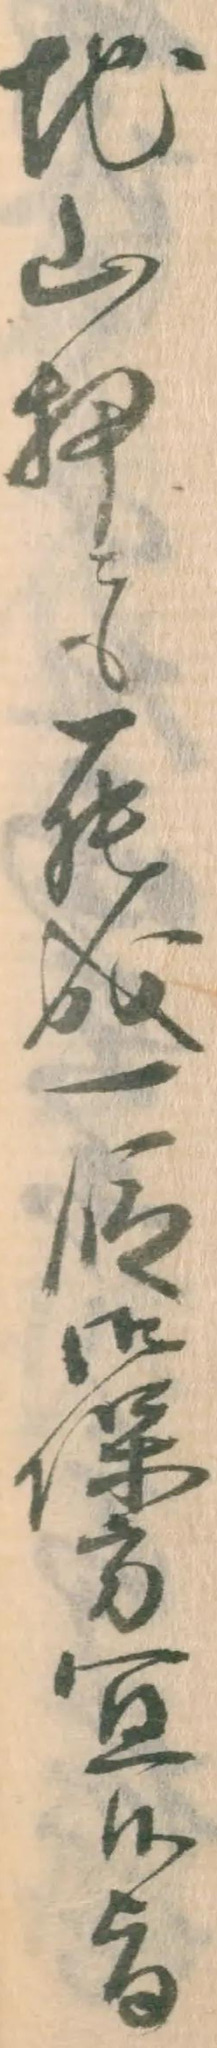地山押ニも罷成一段御保方宜候旨
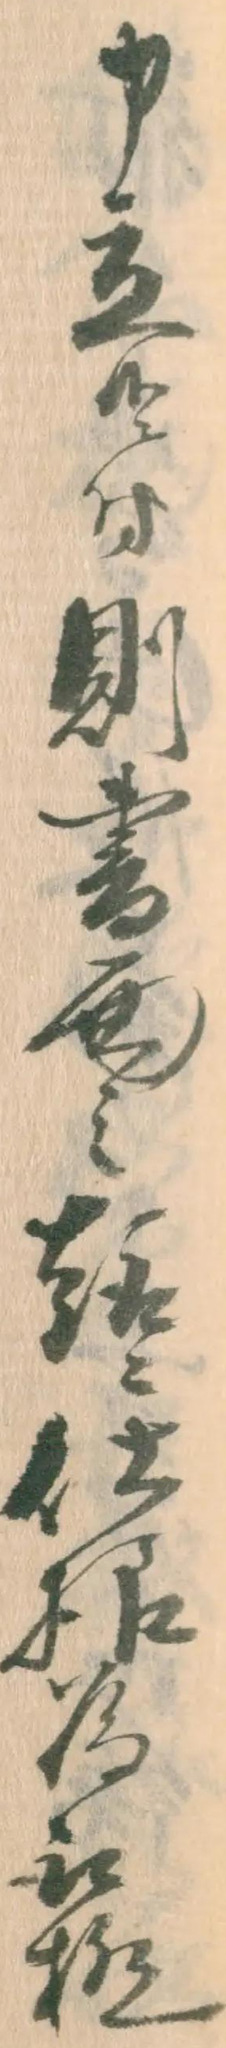申立候ニ付則書面之趣ニ仕様為取極
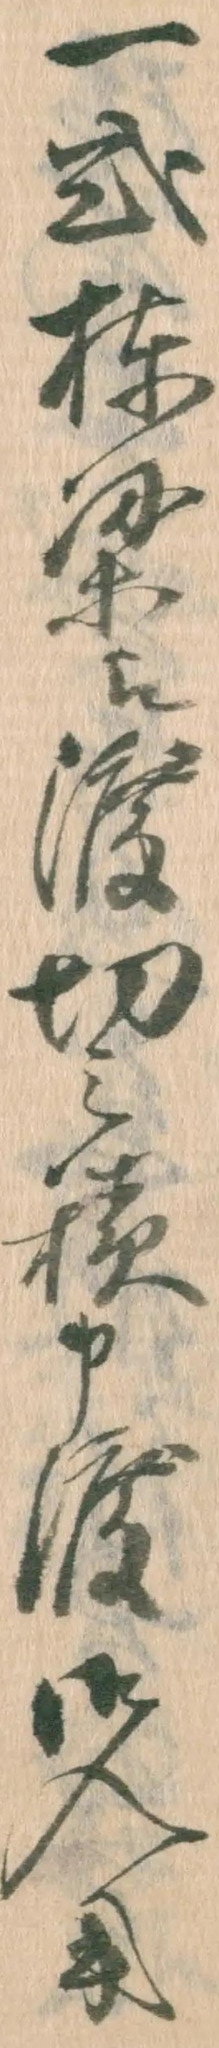一式棟梁え渡切之積申渡御入用
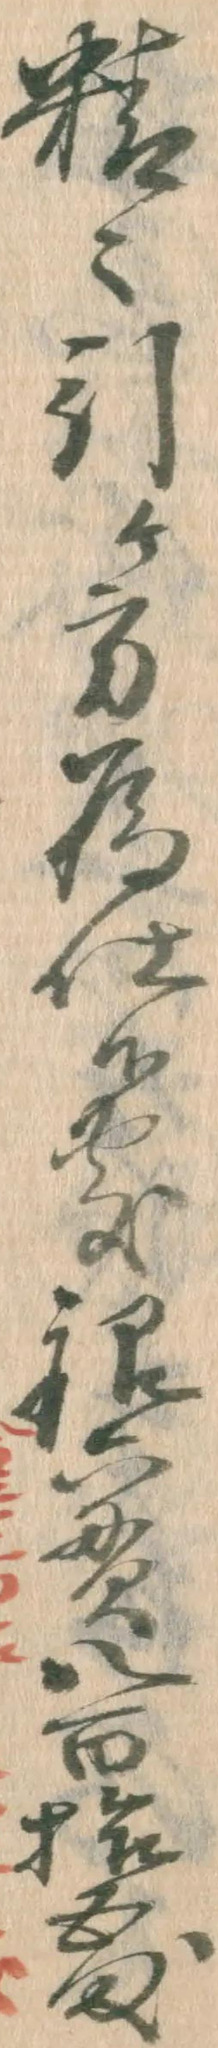精〻引ケ方為仕候処銀六貫八百拾五匁
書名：七十冊物類集 71巻. [44] 四十三 牢屋敷御普請御修覆地震ニ付骨折候牢屋掛御褒美之部
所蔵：国立国会図書館 National Diet Library, JAPAN
